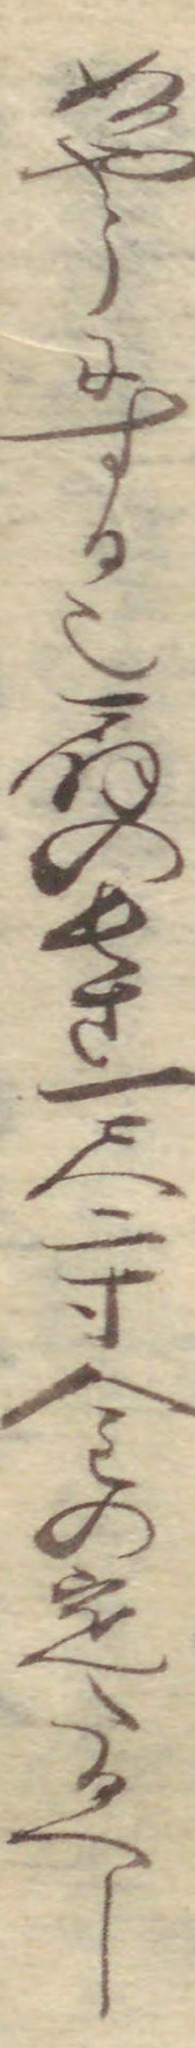ぬやうにする也扇の長さ一尺二寸金の定たるへし
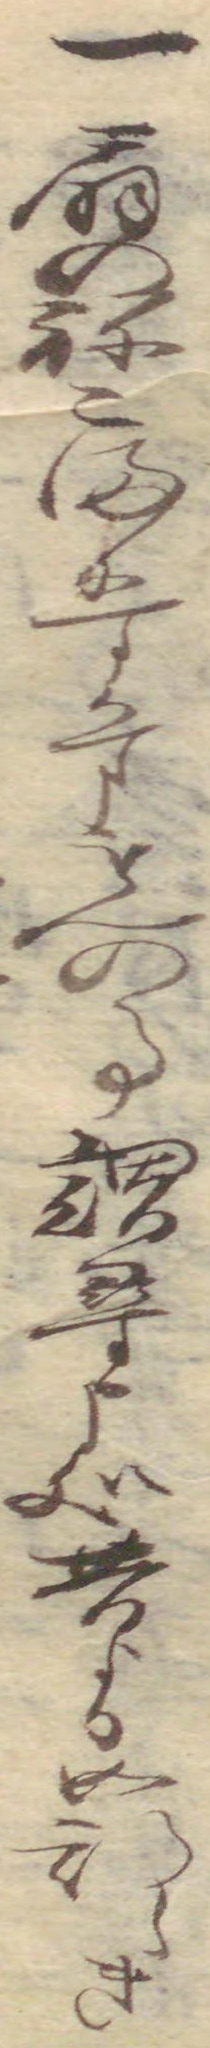一扇のねこまにすかすもんの事謂尋申処昔より如斯しき
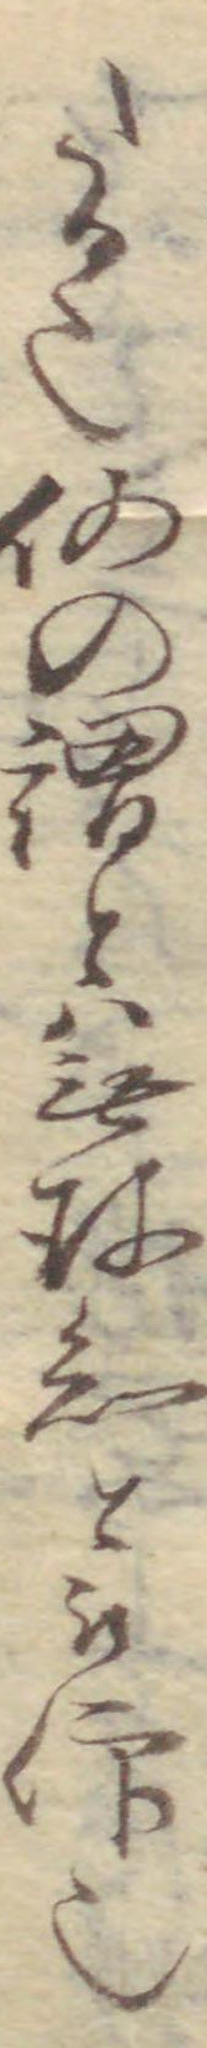たる也何の謂とハ無存知と被仰也
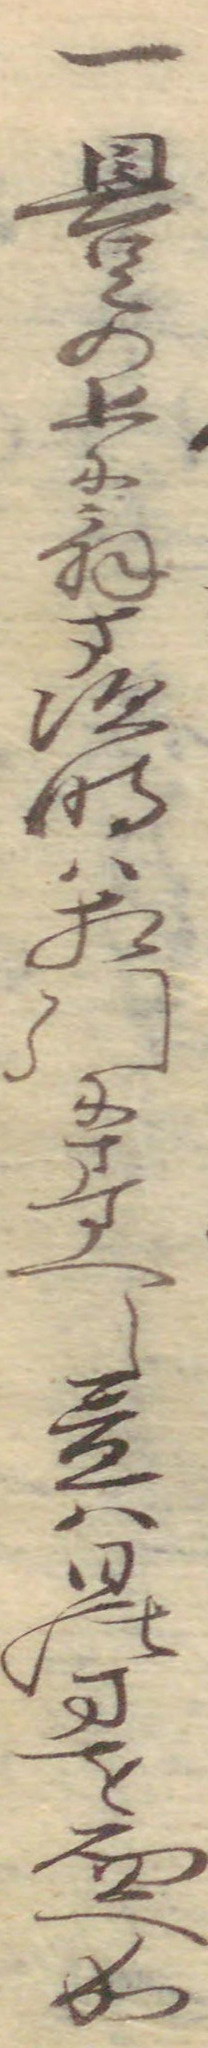一具足の上に扇さす時ハ相引にさすへし昼ハ日の方を面へ成
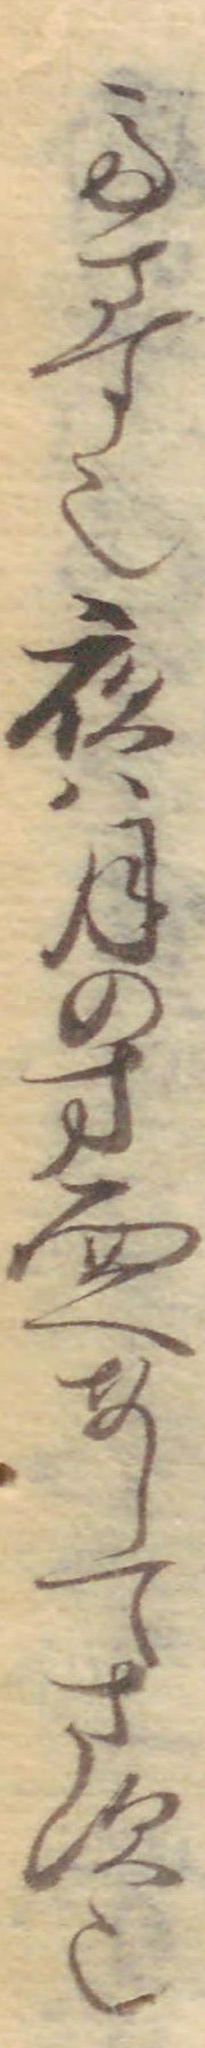てさす也夜ハ月の方面へなしてさす也

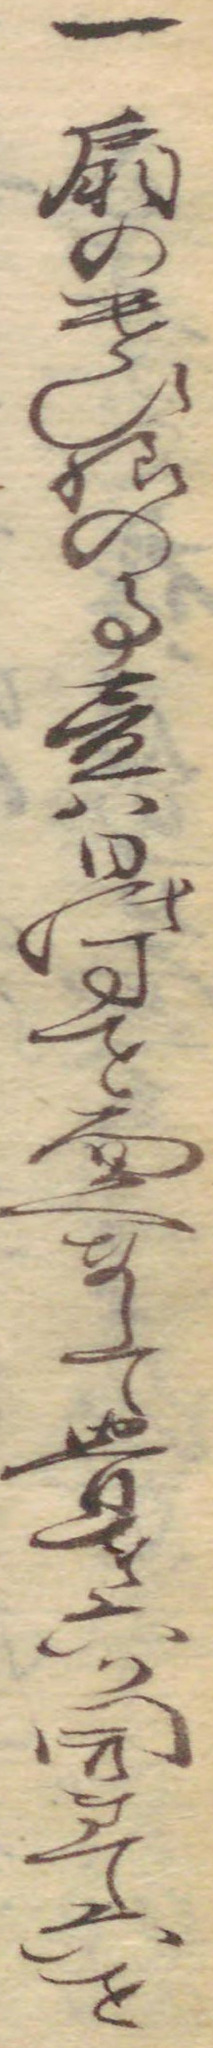一扇の遣い様の事昼ハ日の方を面へなして骨を六ツ開きて六を
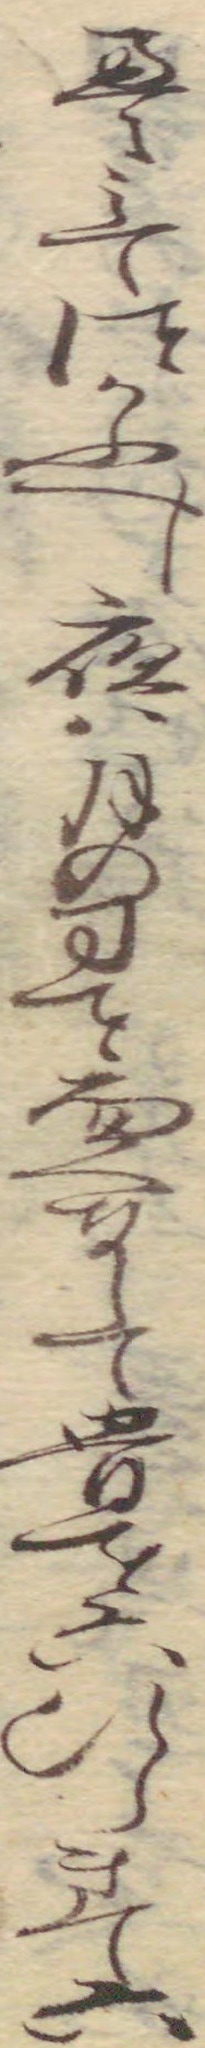畳ミてつかふへし夜ハ月の方を面へなして骨を六ひらきて六
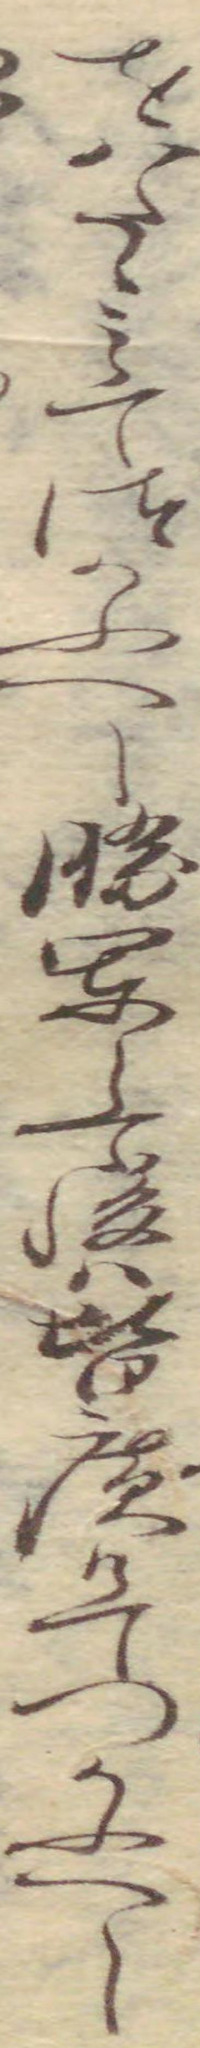をハたゝミてつかふへし勝いくさ軍して後ハ皆広けてつかふへし
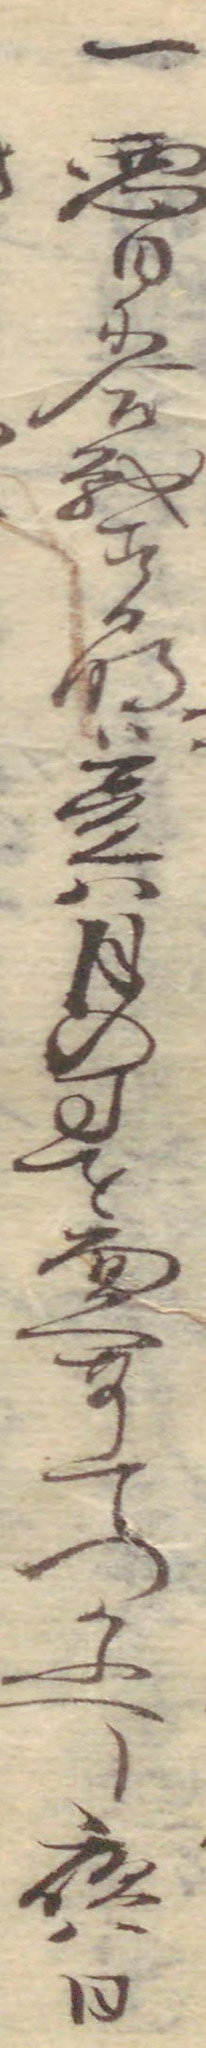一悪日に合戦する時ハ昼ハ月の方を面へなしてつかふへし夜ハ日
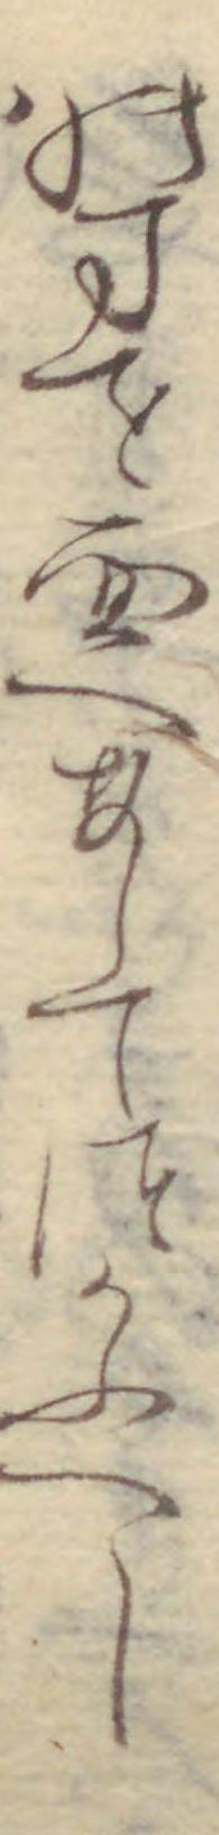の方を面へなしてつかふへし
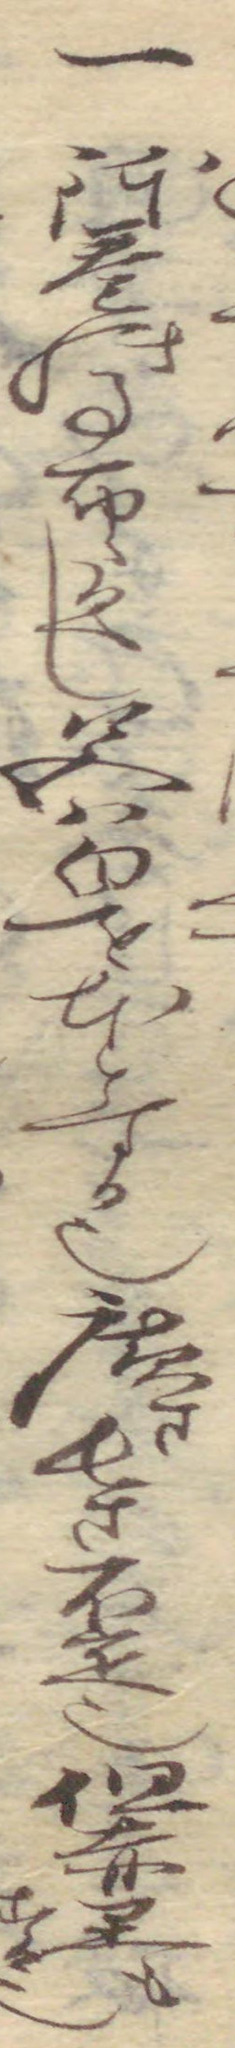一鉢巻の事布たるへし色ハ白を本とする也広さ長さ不定也但赤黒もする也
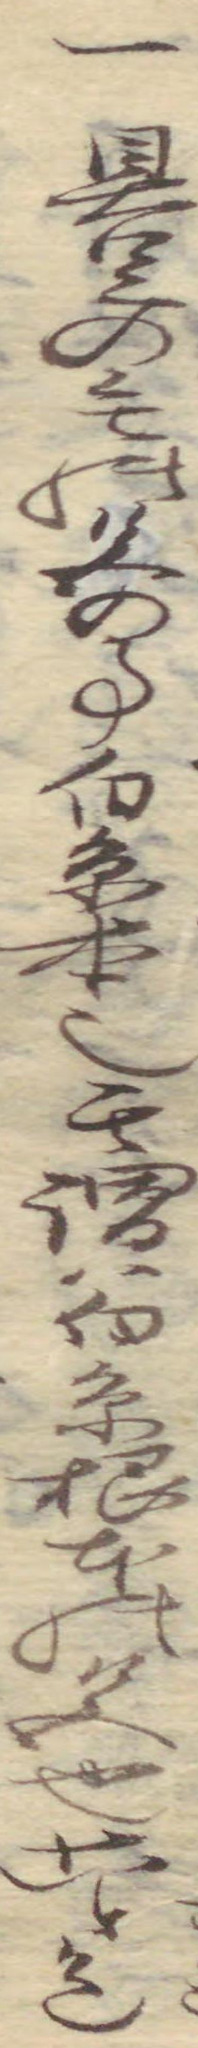一具足の毛の色の事白糸本也其謂ハ白糸根本の色也こと色
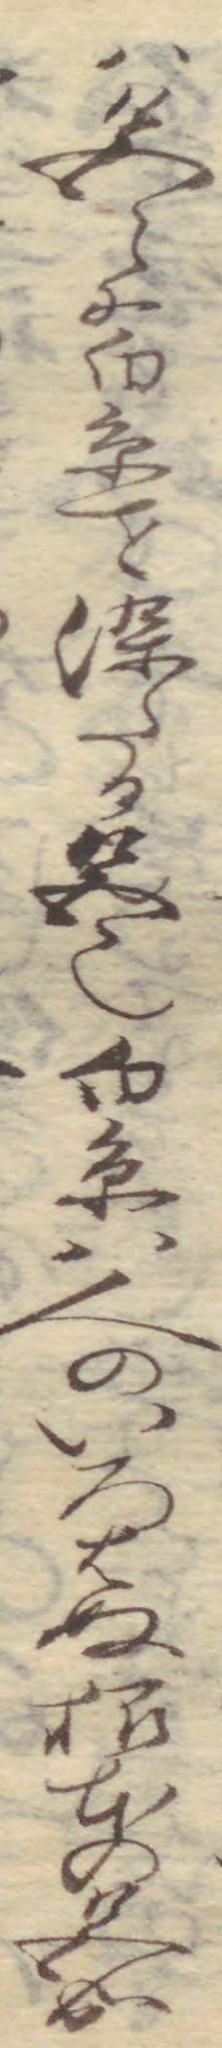ハ色々に白糸を染たる色也白糸ハ人のいろはぬ様本の色成
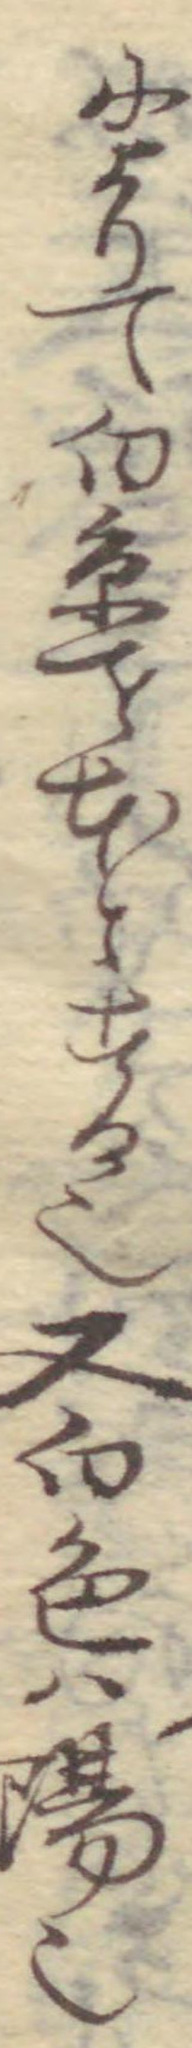によりて白糸を本とする也又白色ハ陽也
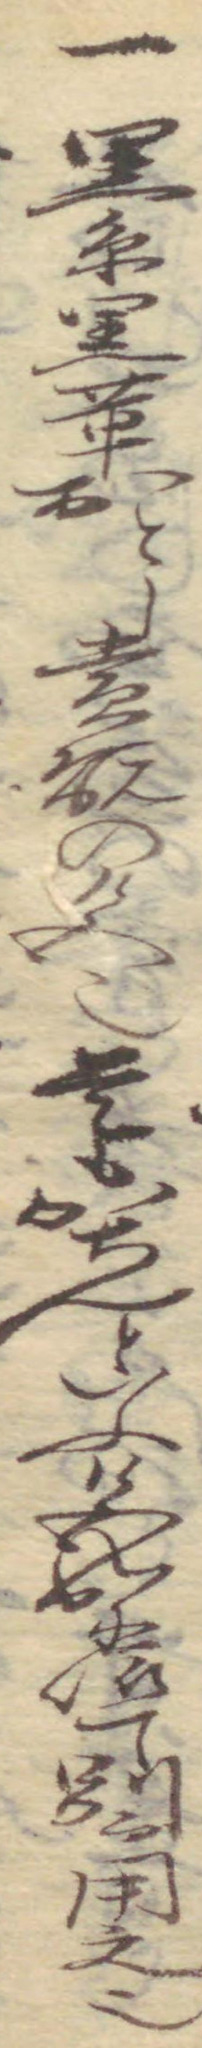一黒糸黒革おとし賞玩の色也是もかちんといふ色成に依て別而用之也は
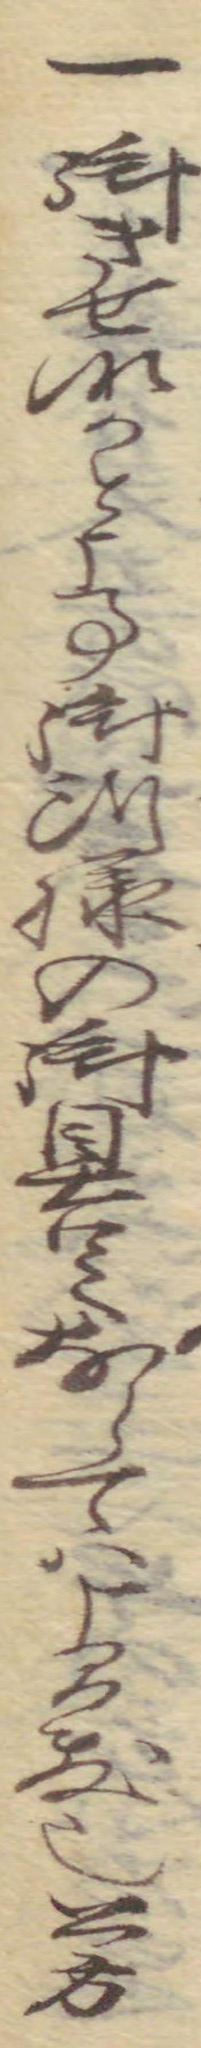一御きせなかと申事御所様の御具足ならてハ申間敷也公方
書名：鶯宿雑記. 巻199-200
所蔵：国立国会図書館 National Diet Library, JAPAN
